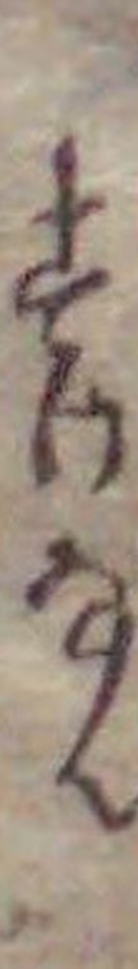すけなん
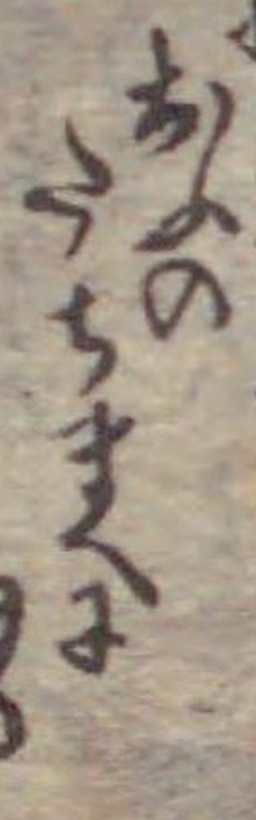たちまへに
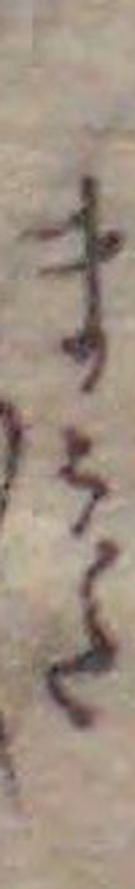まんた

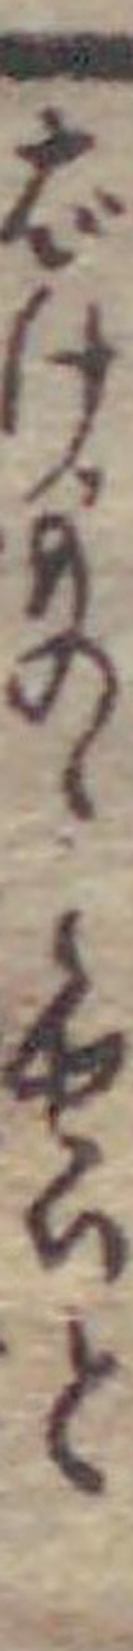ばけものゝせいと
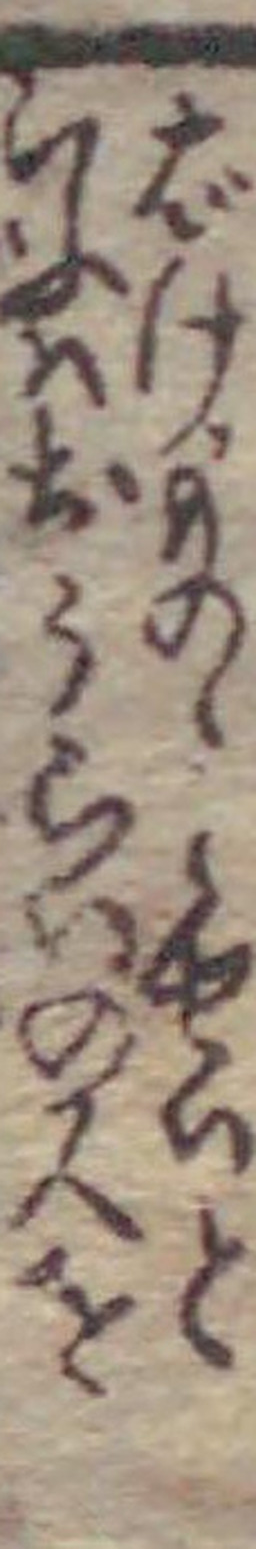いふはおうらいの人を
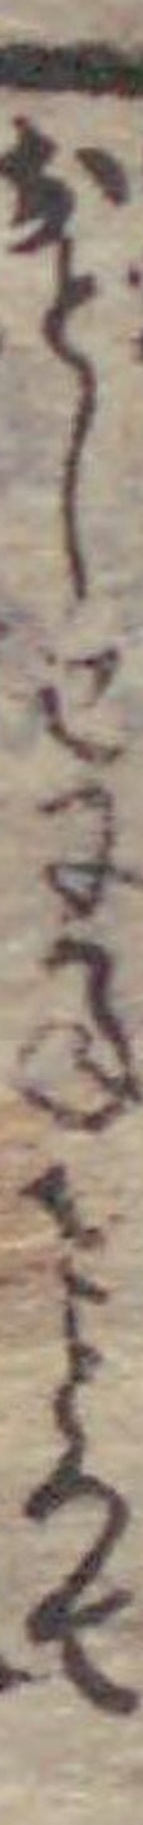おどしせにかねをとつて
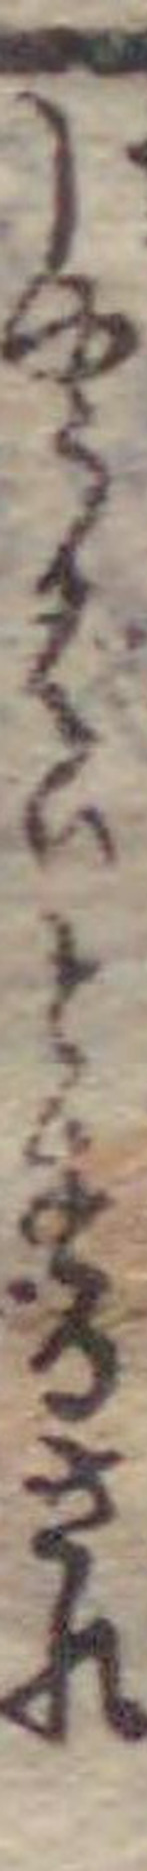しやうばいとするされ
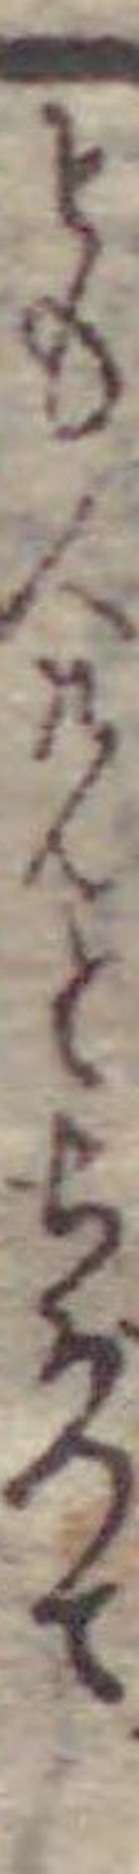とも人けんとちがつて
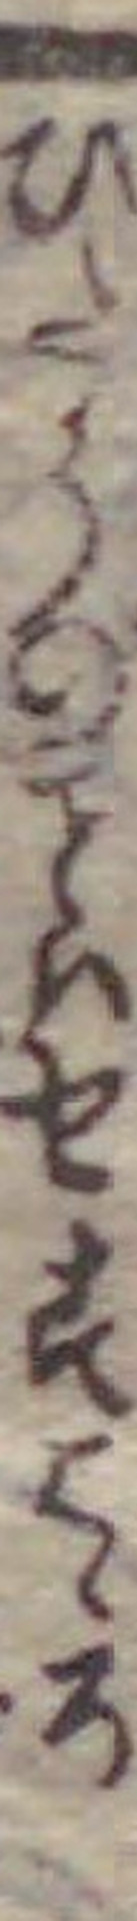ひたうのことはせすこゝろ
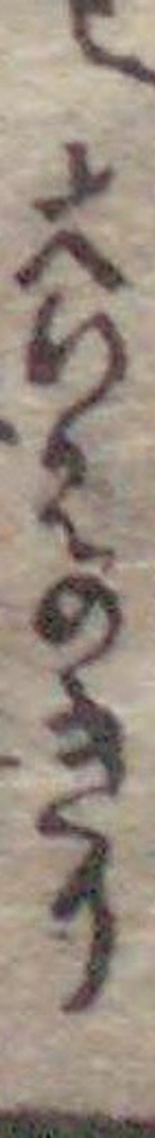大いそのきり
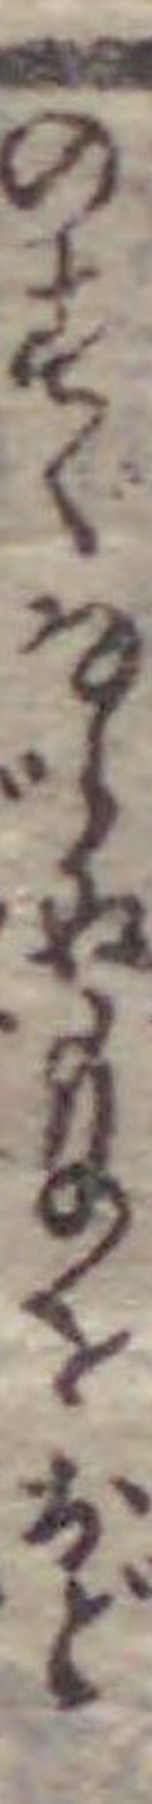のすぐならぬものをおど
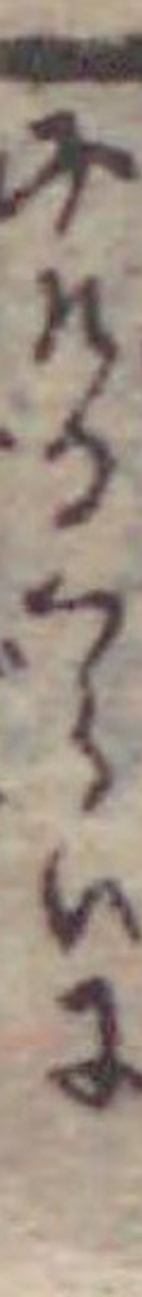にけるくらいに
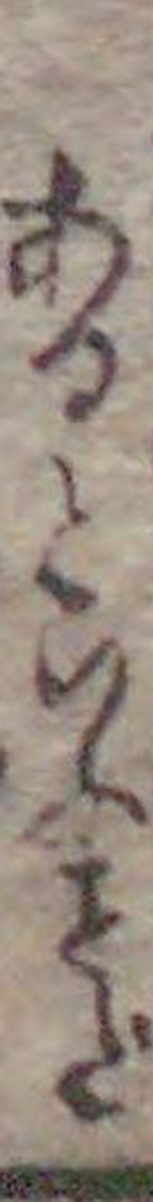あるといふことだ
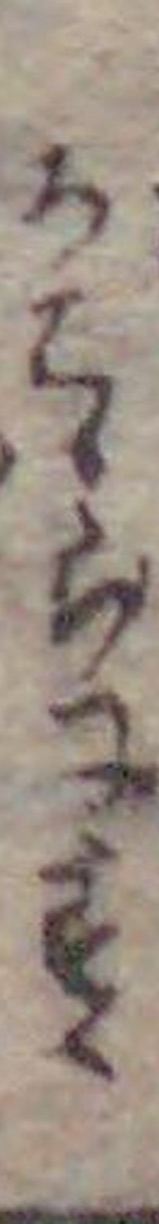かこゝらにすへ
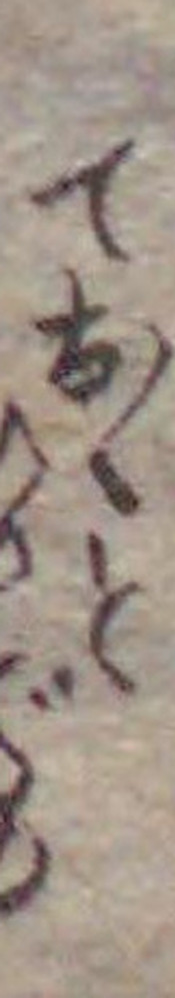ておくと
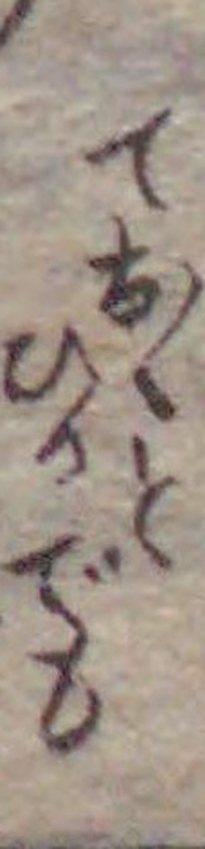ておくと
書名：化物見世開 : 2巻
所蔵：国立国会図書館 National Diet Library, JAPAN
